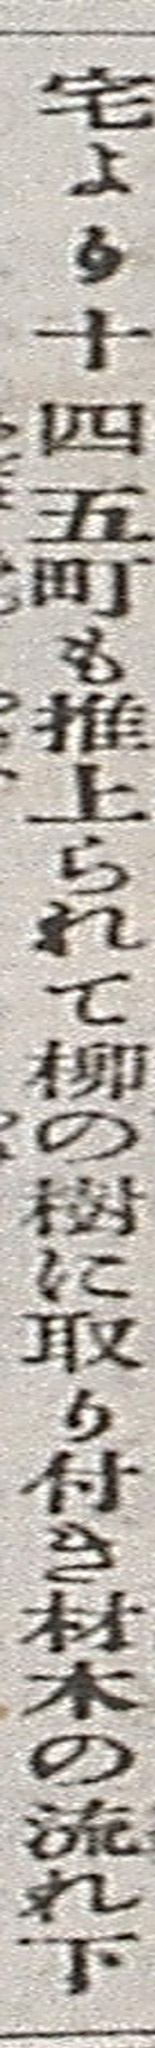宅より十四五町も推上られて柳の樹に取り付き材木の流れ下
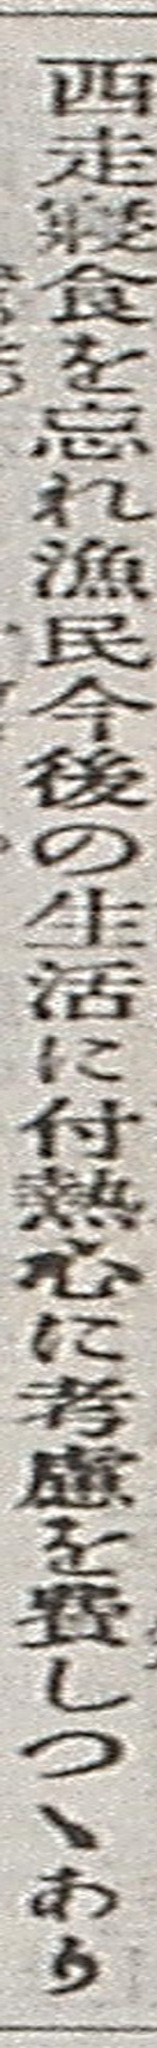西走寝食を忘れ漁民今後の生活に付熱心に考慮を費しつゝあり
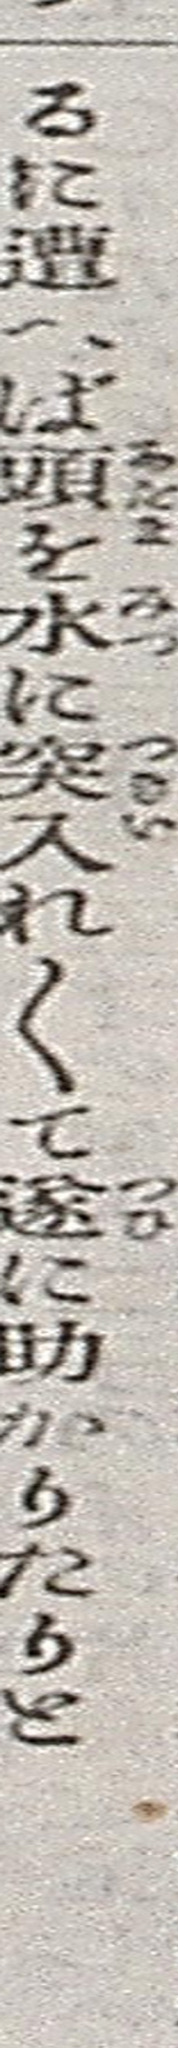るに遭へば頭を水に突入れ〳〵て遂に助かりたりと
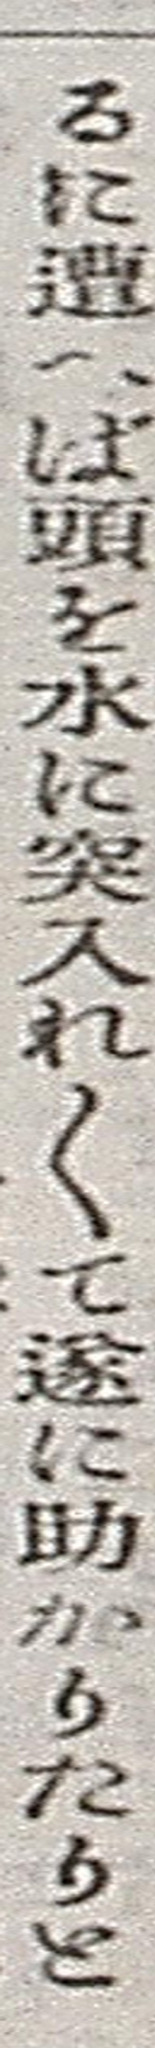るに遭へば頭を水に突入れ〳〵て遂に助かりたりと
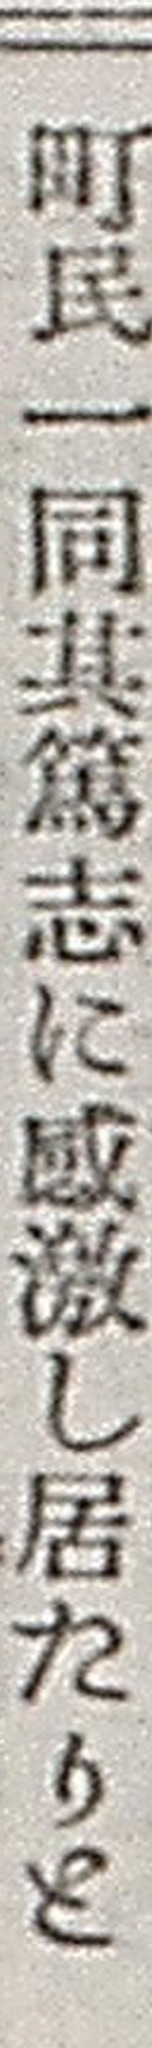町民一同其篤志に感激し居たりと
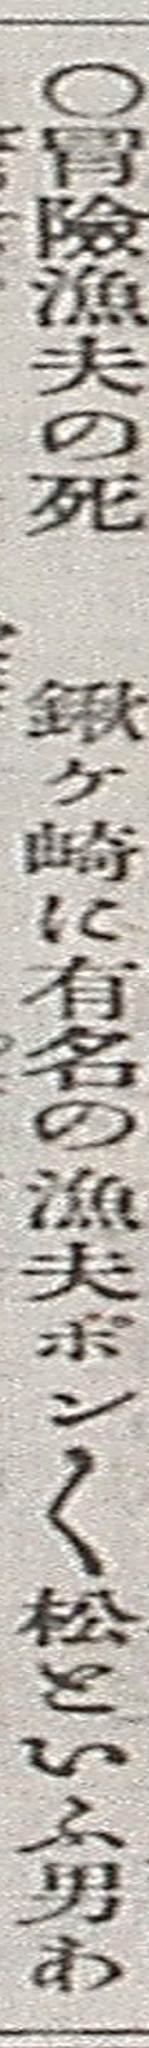○冒険漁夫の死鍬ヶ崎に有名の漁夫ポン〳〵松といふ男あ
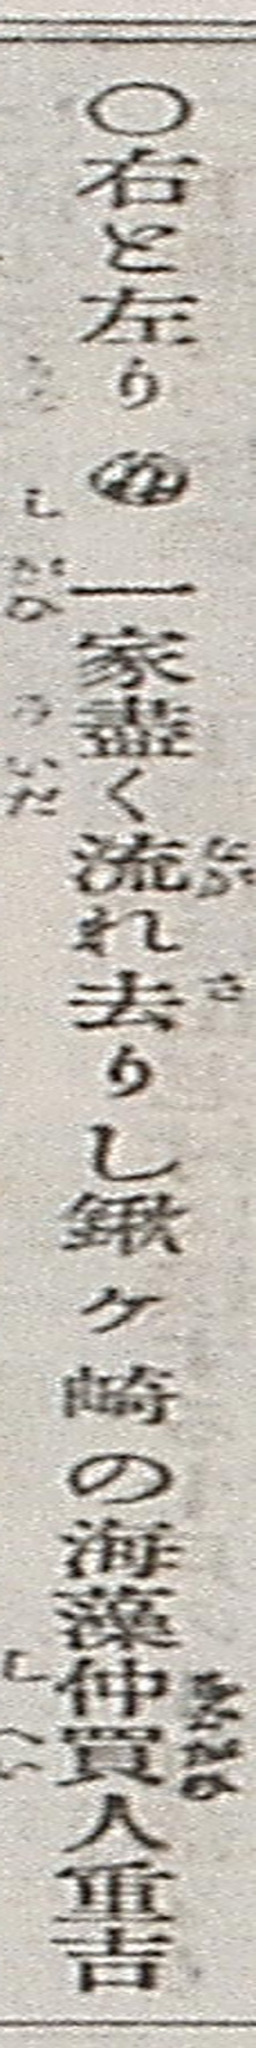○右と左り一家尽く流れ去りし鍬ヶ崎の海藻仲買人重吉
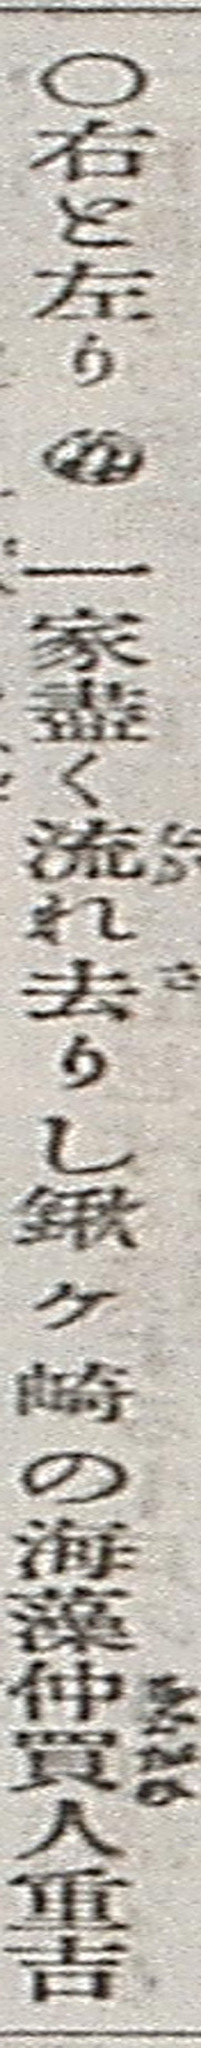○右と左り一家尽く流れ去りし鍬ヶ崎の海藻仲買人重吉
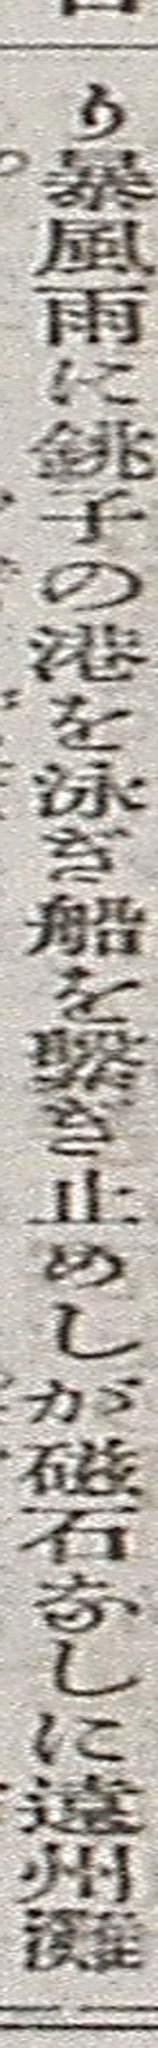り暴風雨に銚子の港を泳ぎ船を繋ぎ止めしが磁石なしに遠州灘
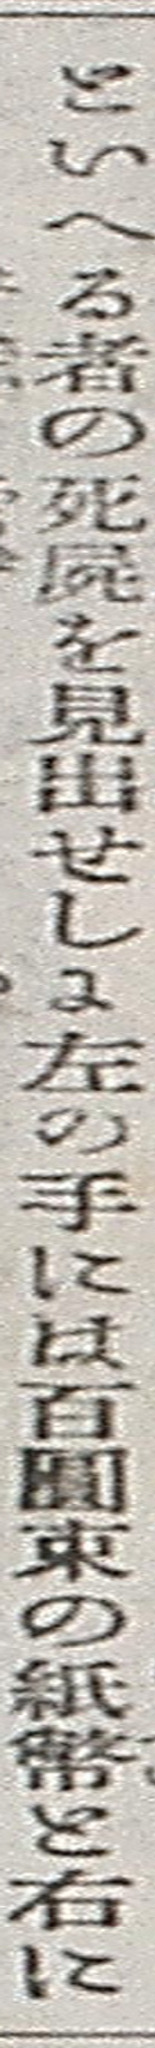といへる者の死屍を見出せしに左の手には百円束の紙幣と右に
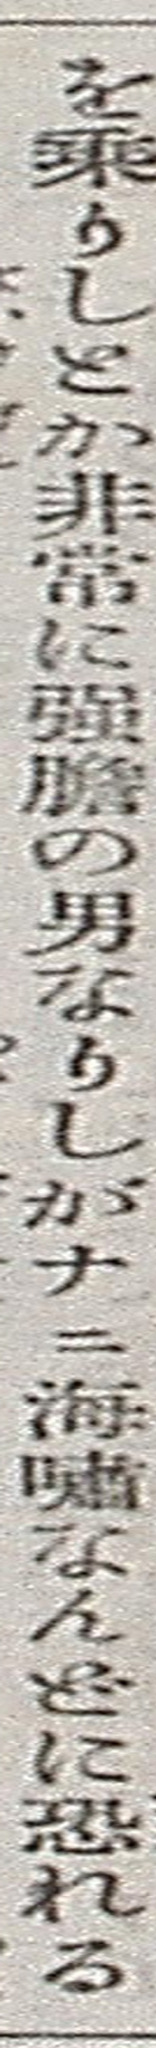を乗りしとか非常に強胆の男なりしがナニ海嘯なんどに恐れる
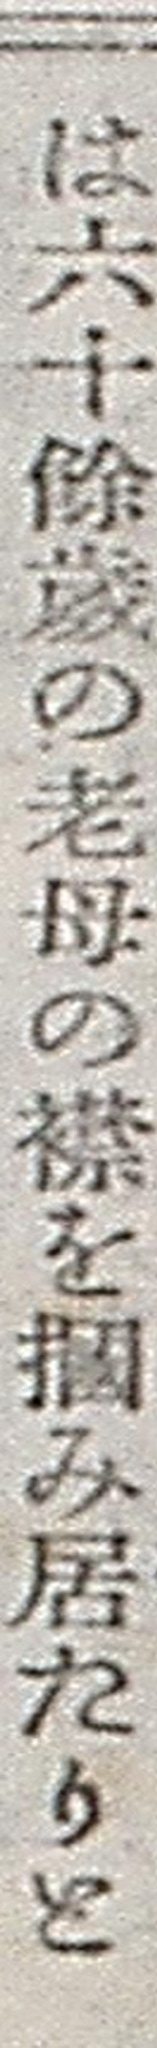は六十余歳の老母の襟を掴み居たりと
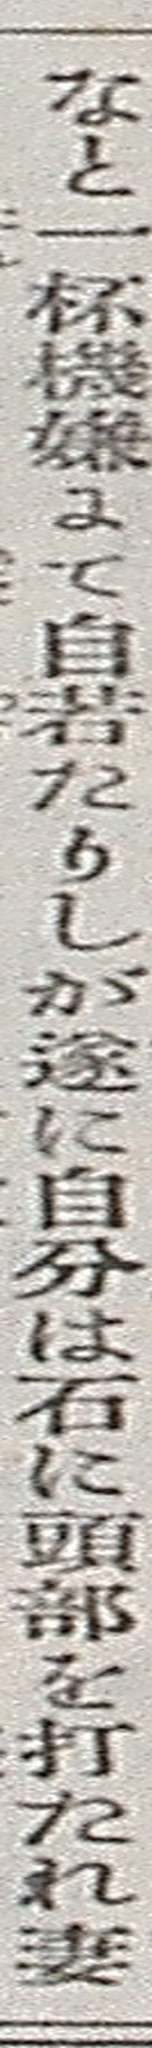なと一杯機嫌にて自若たりしが遂に自分は石に頭部を打たれ妻
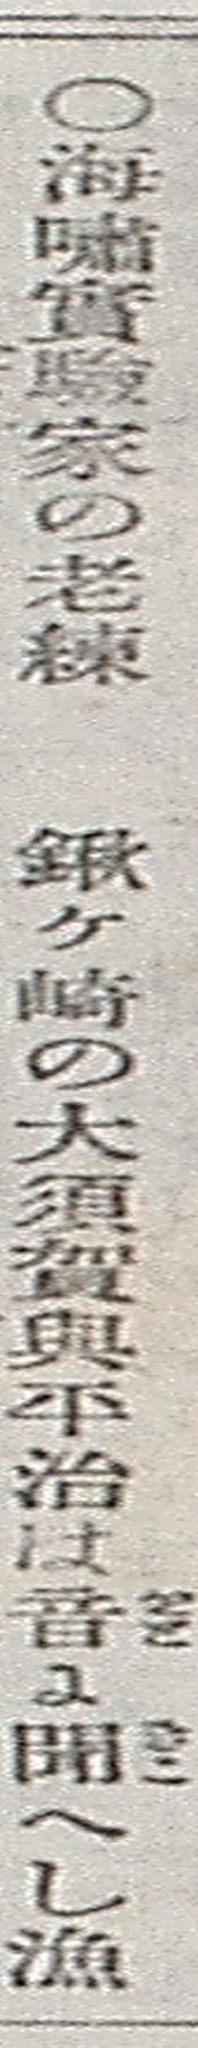○海嘯実験家の老練鍬ヶ崎の大須賀與平治は音に聞へし漁
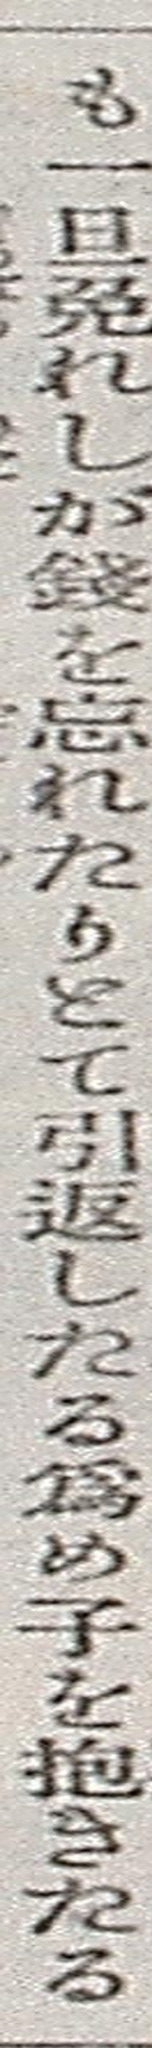も一旦免れしが銭を忘れたりとて引返したる為め子を抱きたる
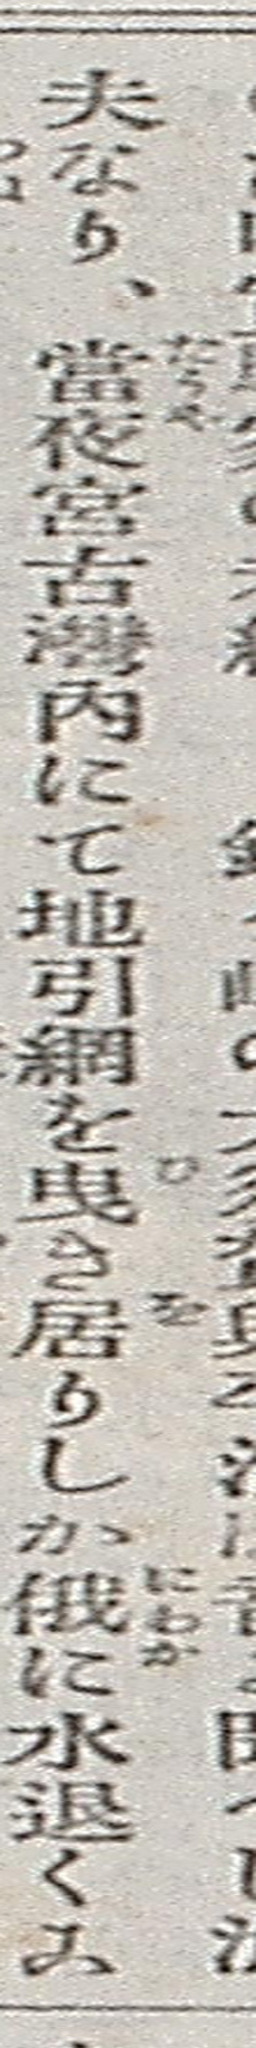夫なり、当夜宮古湾内にて地引網を曳き居りしか俄に水退くこ
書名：風俗畫報臨時増刊第百二十號　大海嘯被害録（下）
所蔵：東京大学地震研究所図書室 Earthquake Research Institute Library, The University of Tokyo, JAPAN
